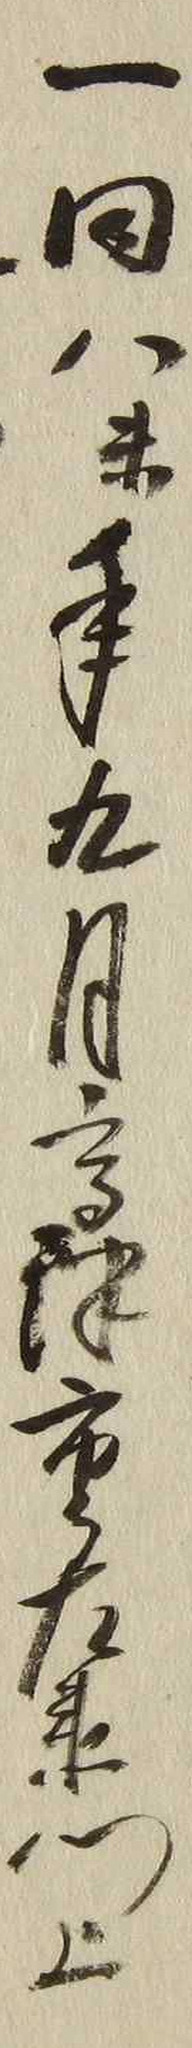一同八未年九月高津市左衛門上
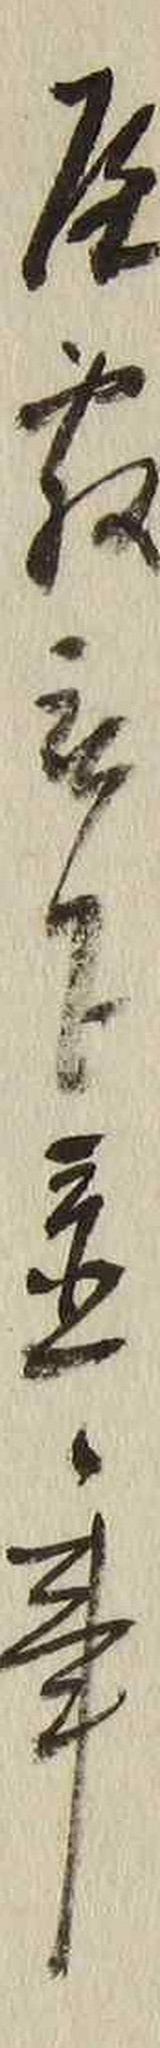屋敷被下置候事
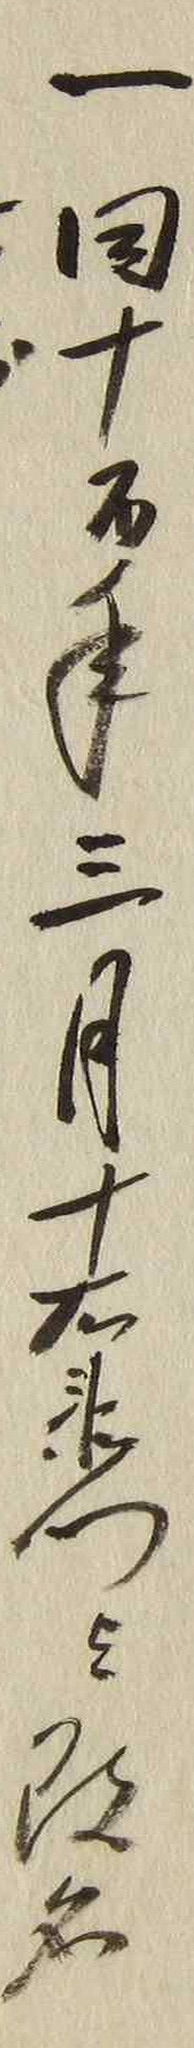一同十酉年三月十右衛門与改名
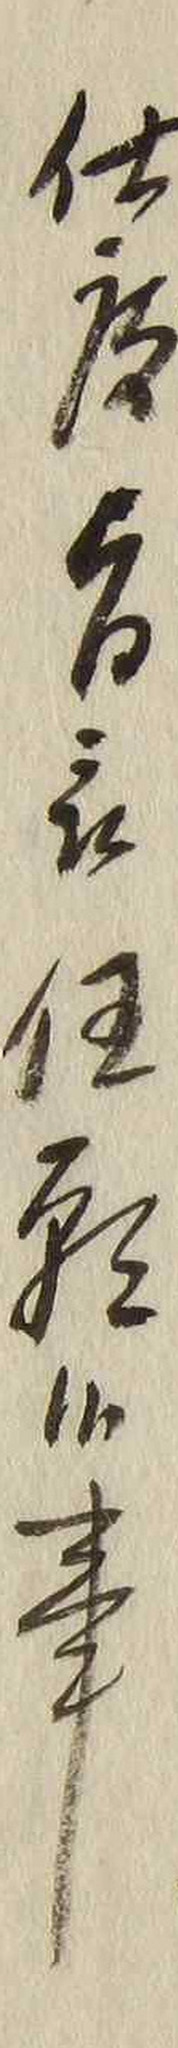仕度旨被任願候事
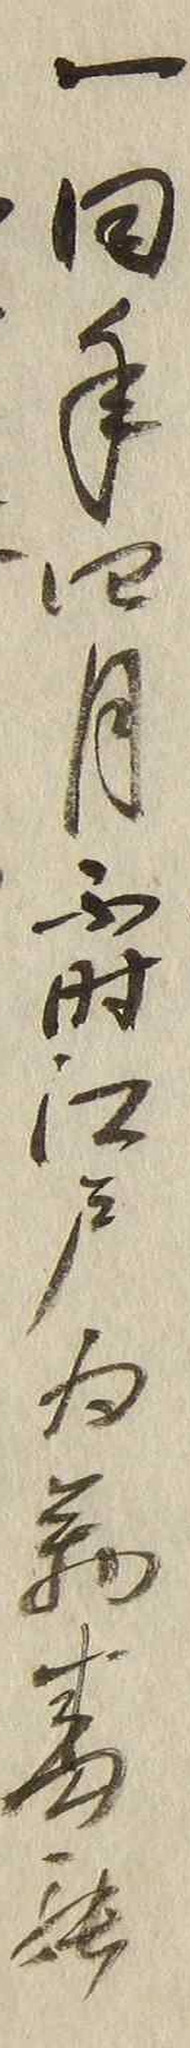一同年四月不時江戸為勤番罷
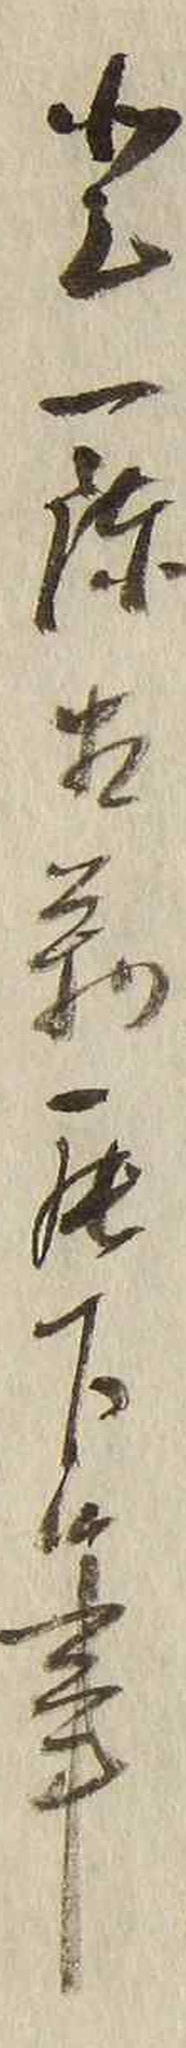登一陣相勤罷下候事

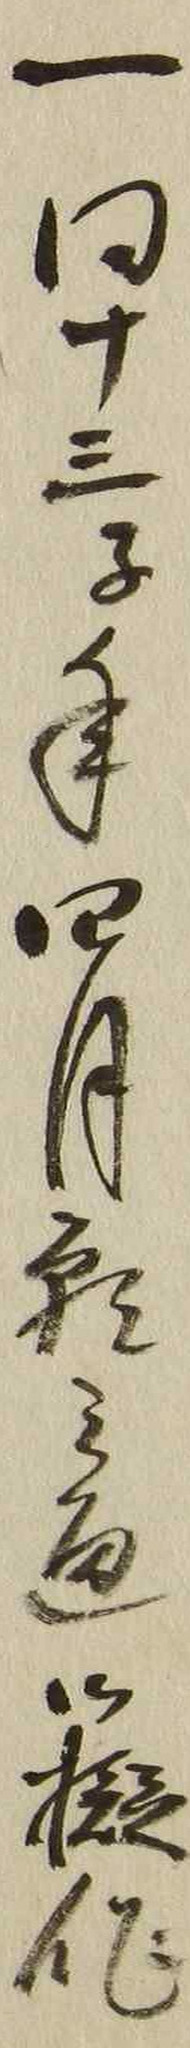一同十三子年四月願之通御擬作
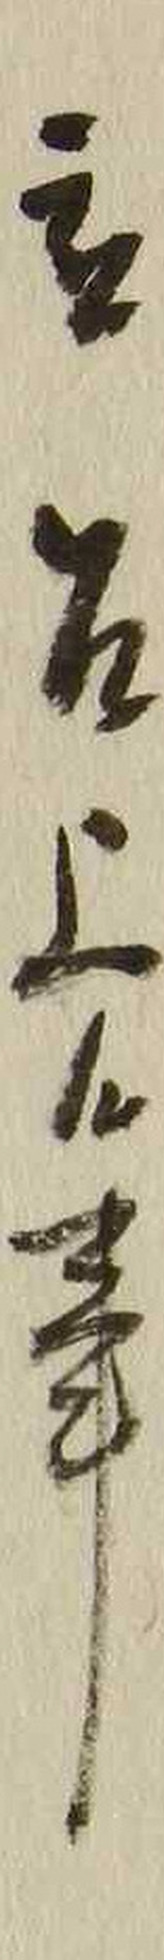被召上候事
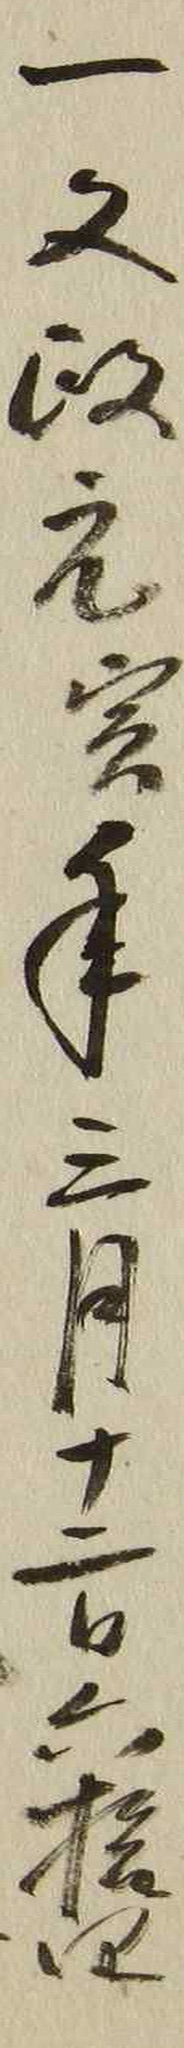一文政元寅年三月十二日六拾四
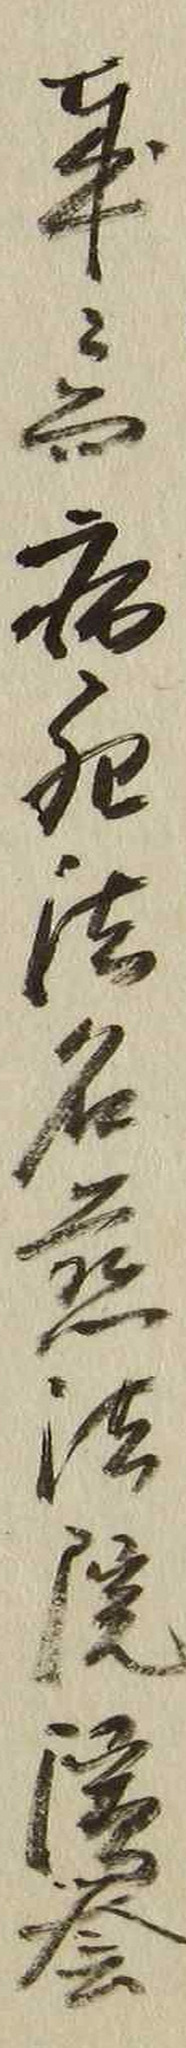歳ニ而病死法名慈法院演誉
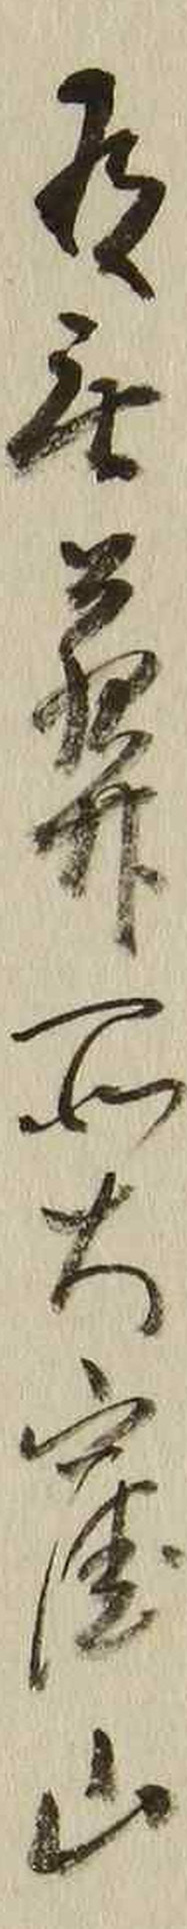有無葬所大窪山
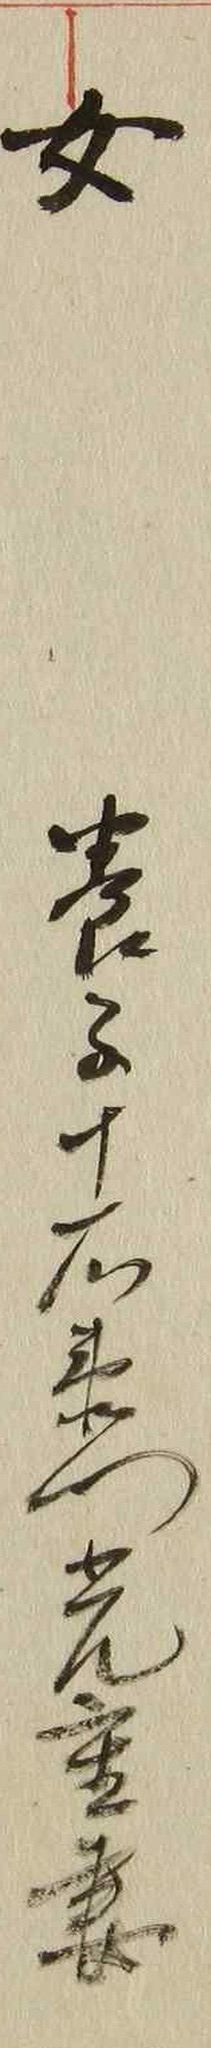女養子十右衛門光重妻
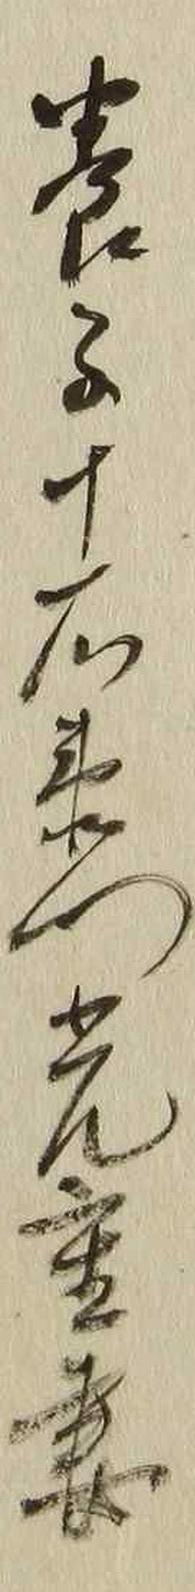女養子十右衛門光重妻
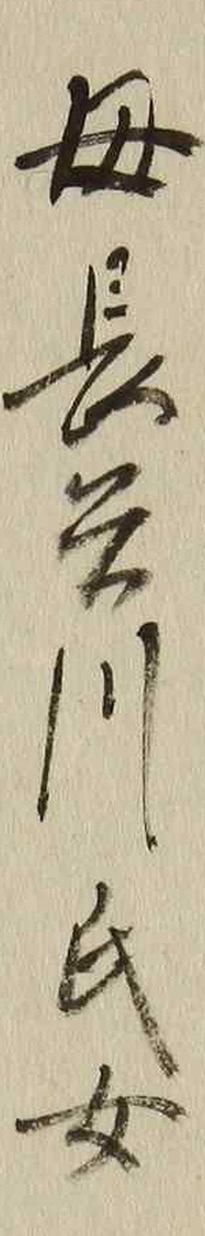母長谷川氏女
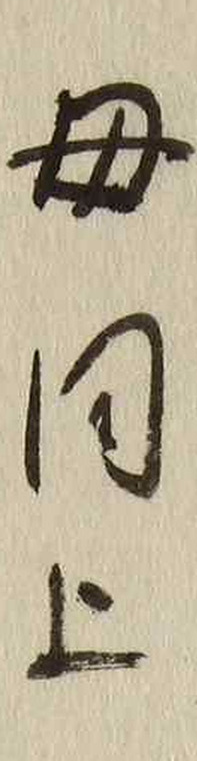母同上
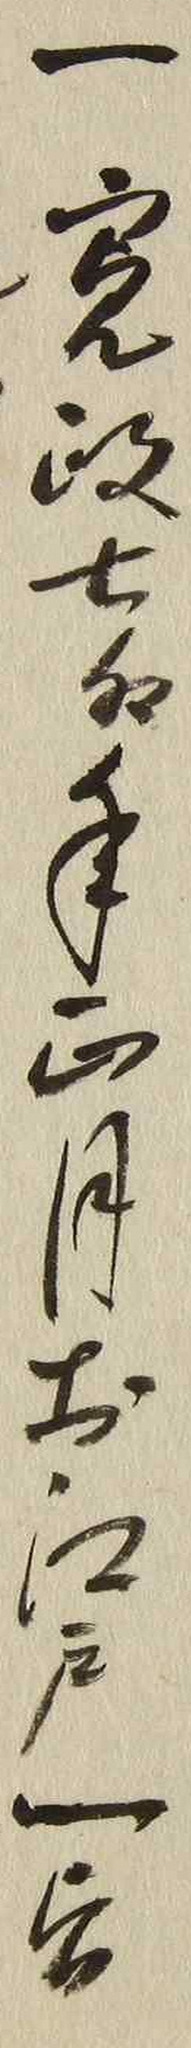一寛政七卯年正月於江戸一旨
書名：諸士系譜　巻之359　す之部9
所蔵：会津若松市立会津図書館
